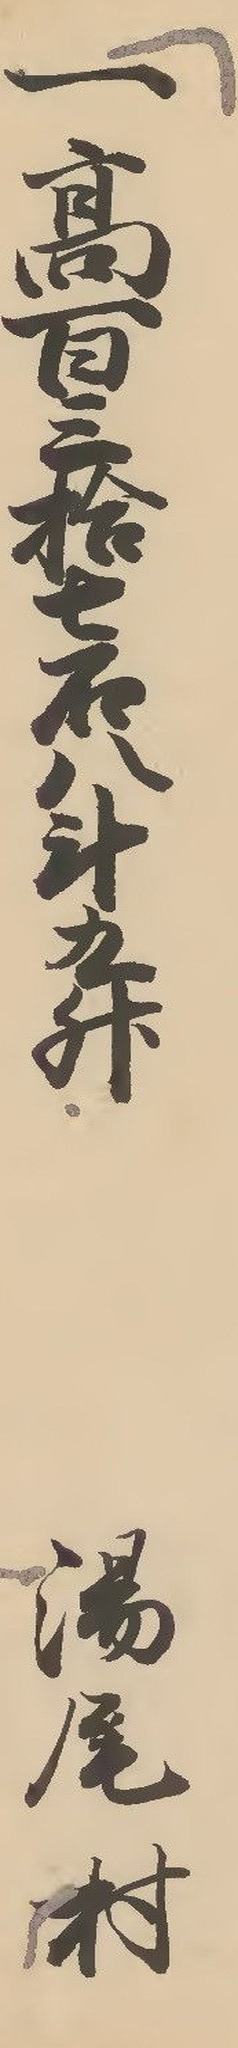一髙百三拾七石八斗九升湯尾村

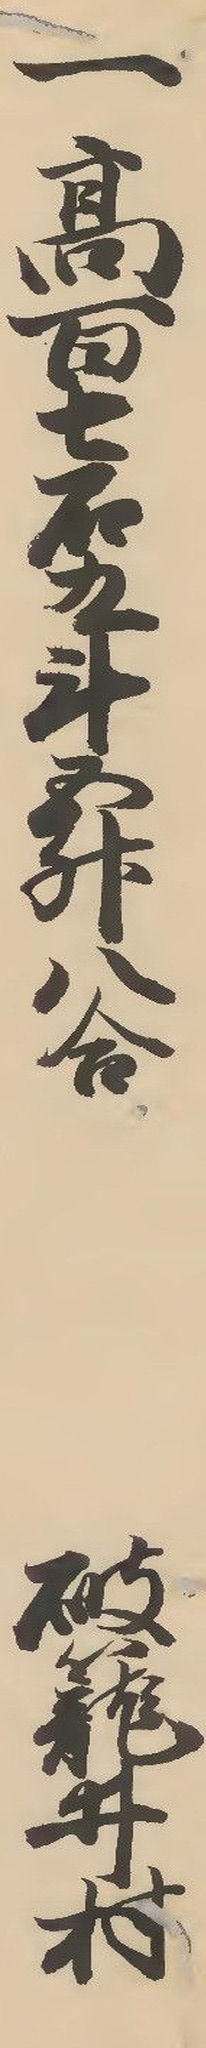一髙百七石九斗五升八合破籠井村
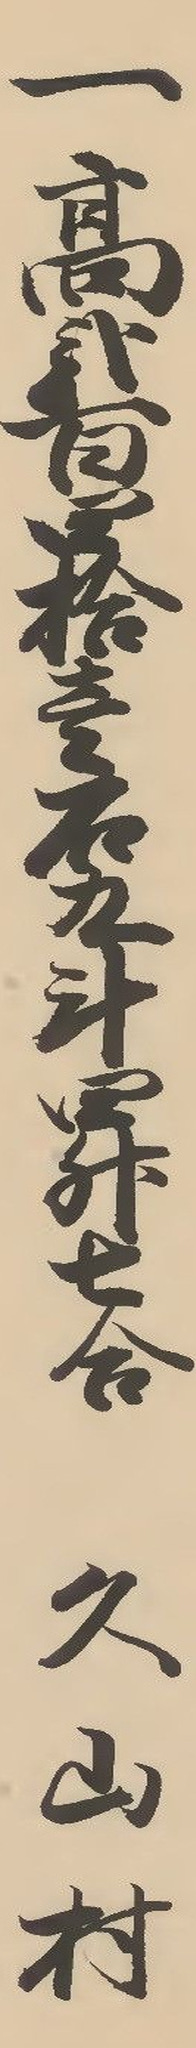一髙弐百四拾壱石九斗四升七合久山村
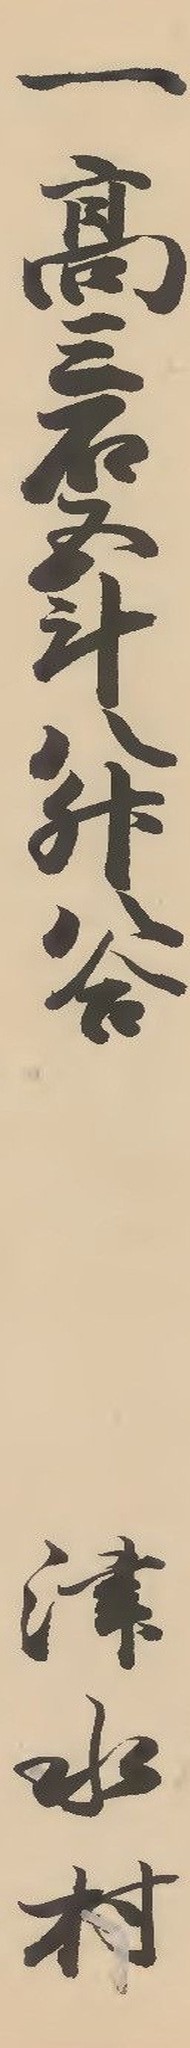一髙三石五斗八升八合津水村
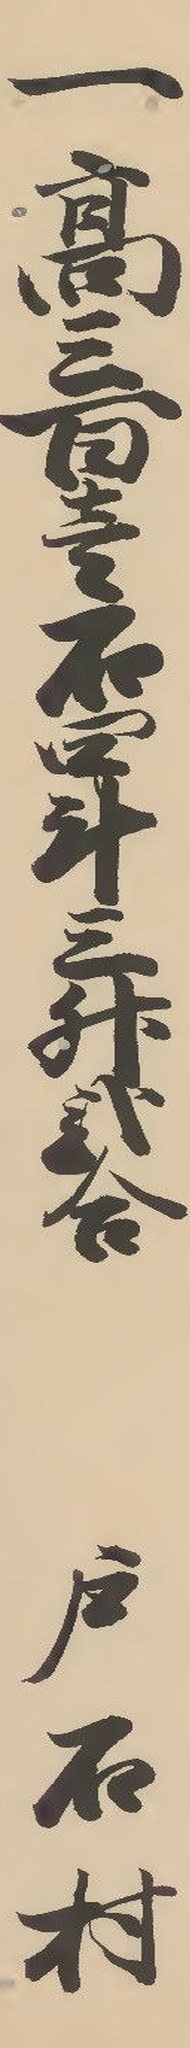一髙三百壱石四斗三升弐合戸石村
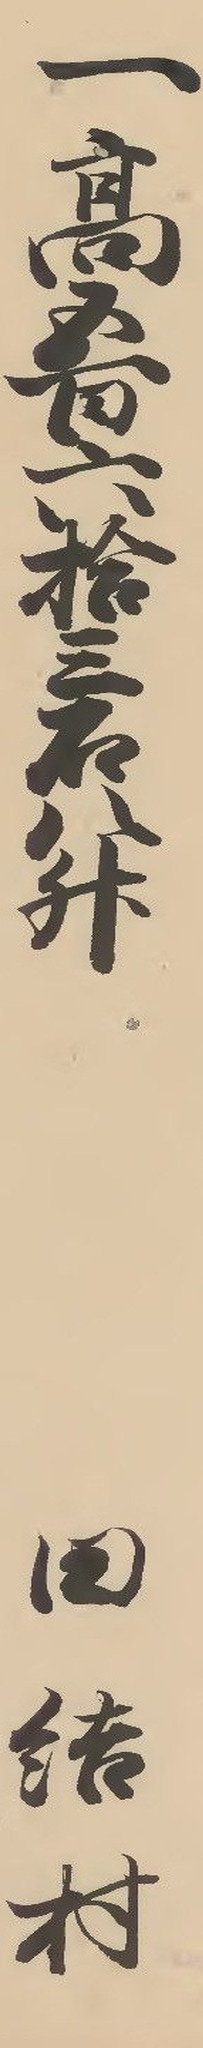一髙五百六拾三石八升田結村
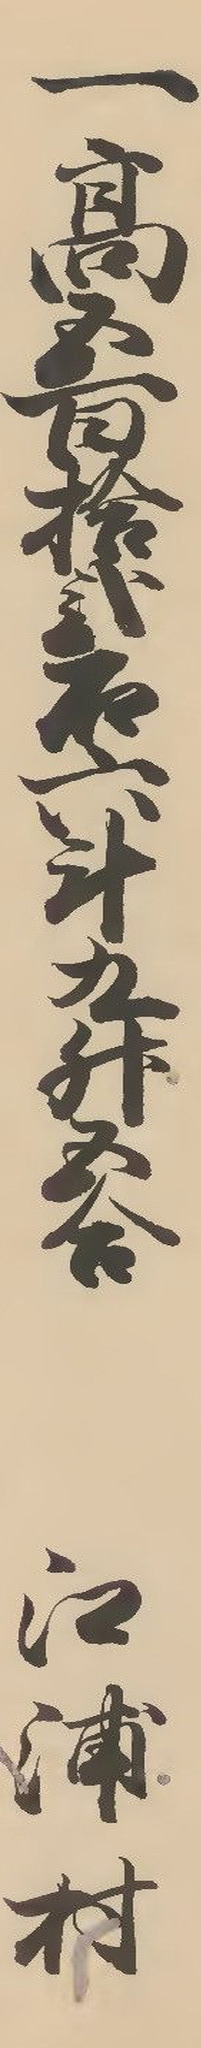一髙五百拾弐石六斗九升五合江浦村
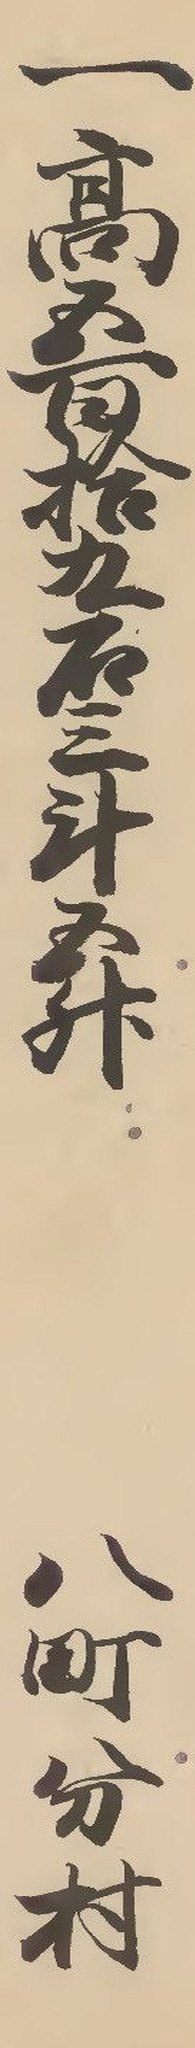一髙五百拾九石三斗五升八町分村
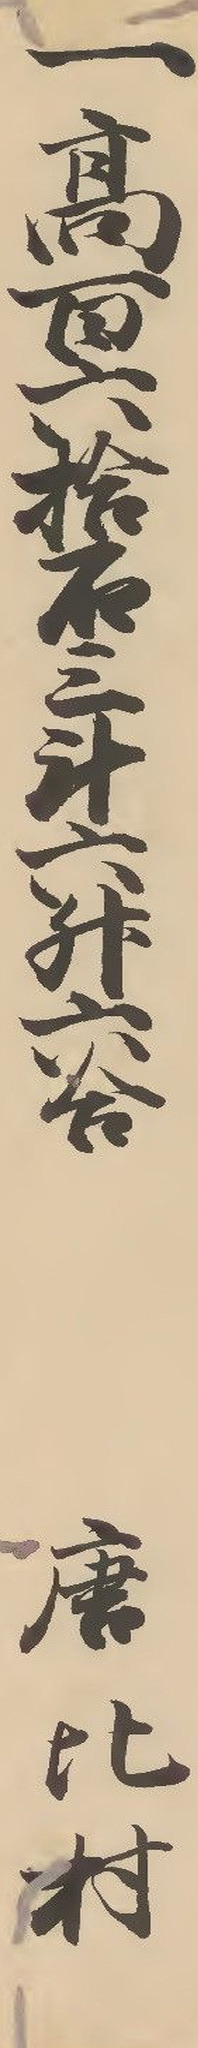一髙百六拾石三斗六升六合唐比村

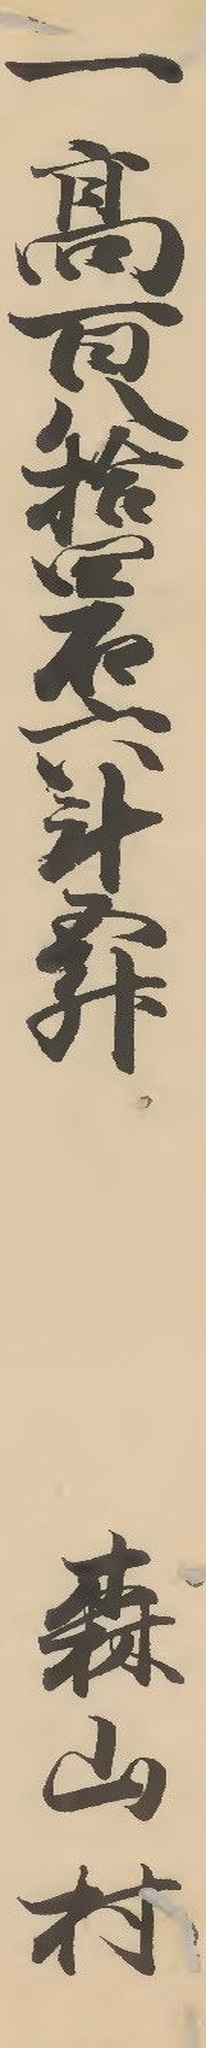一髙百八拾四石六斗五升森山村
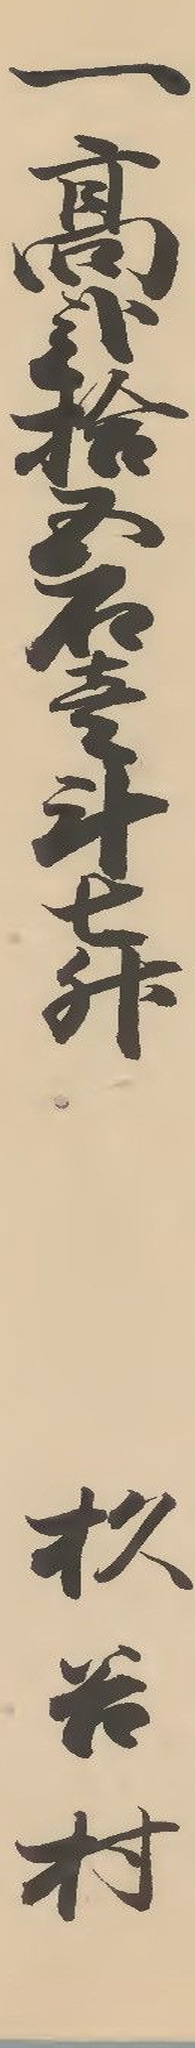一髙弐拾五石壱斗七升杦谷村
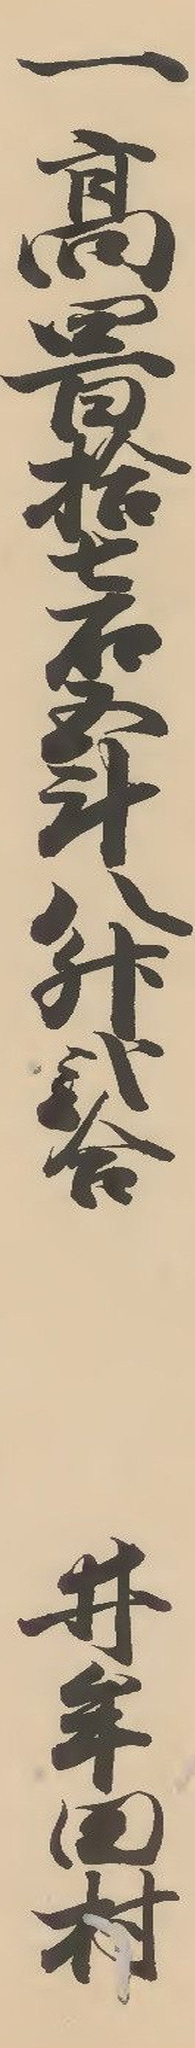一髙四百拾七石五斗八升弐合井年田村
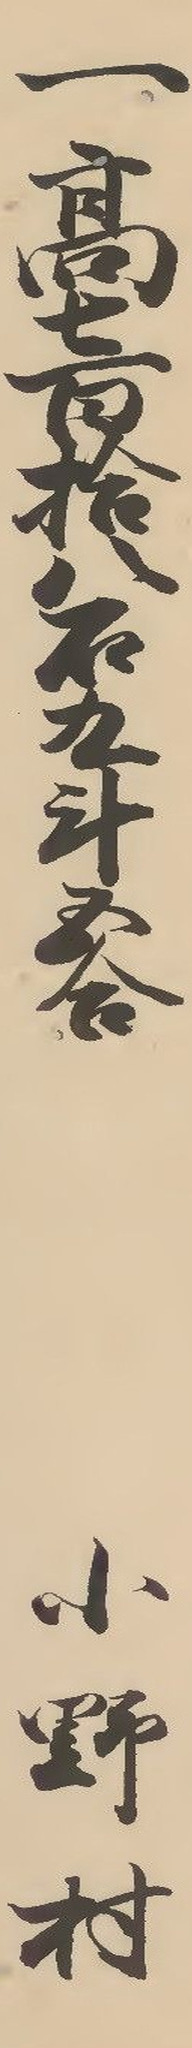一髙七百拾八石九斗五合小野村
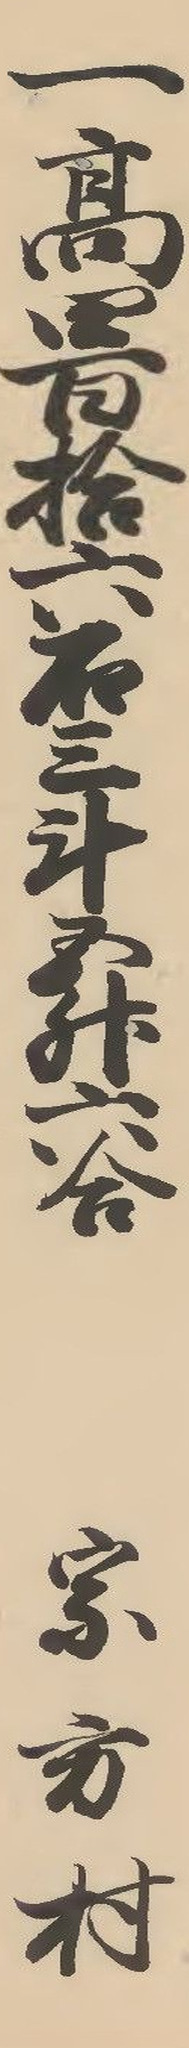一髙四百拾六石三斗五升六合宗方村
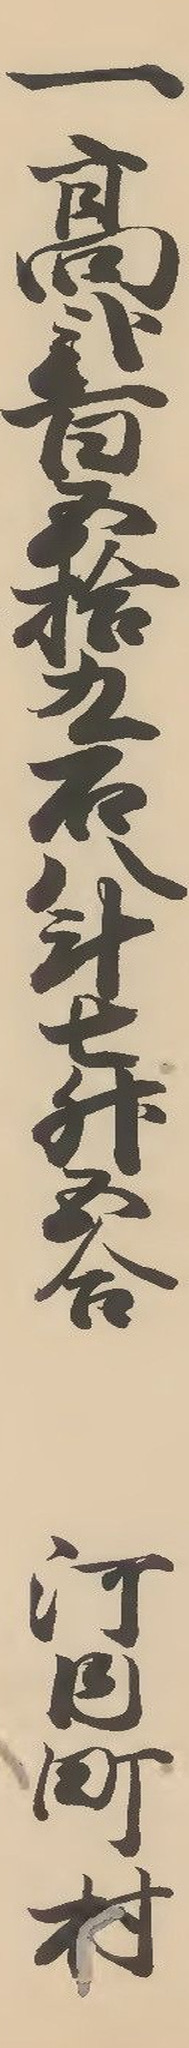一髙弐百五拾九石八斗七升五合河内町村
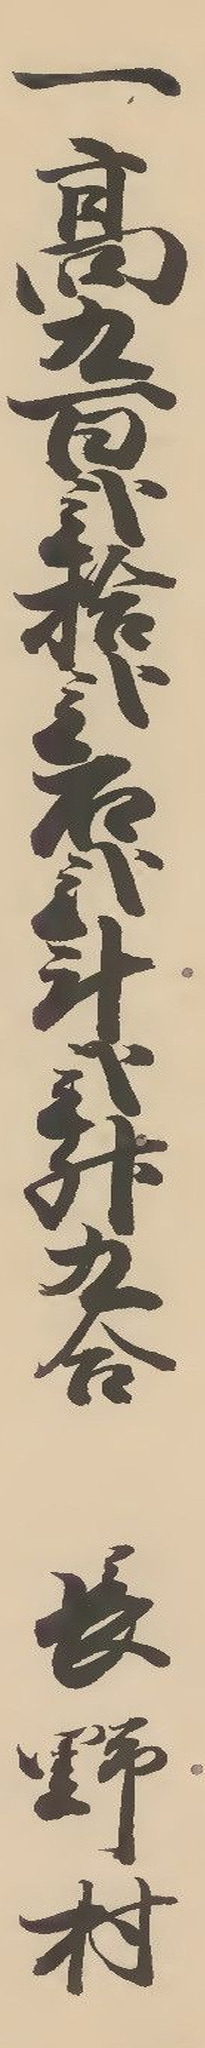一髙九百弐拾弐石弐斗弐升九合長野村
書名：肥前国郷帳
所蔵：国立公文書館 National Archives of Japan
